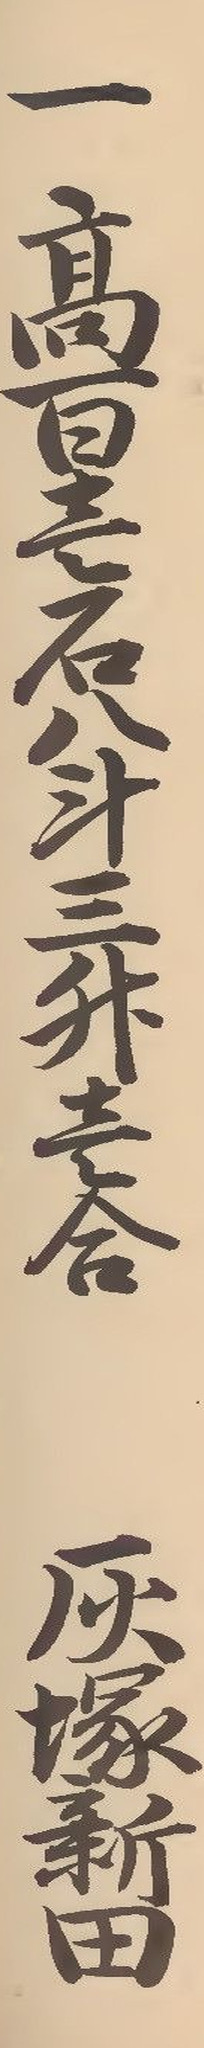一高百壱石八斗三升壱合灰塚新田
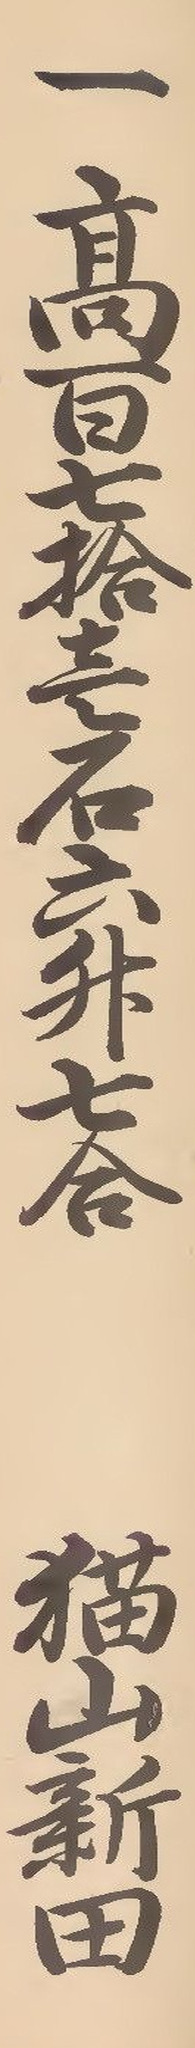一高百七拾壱石六升七合猫山新田
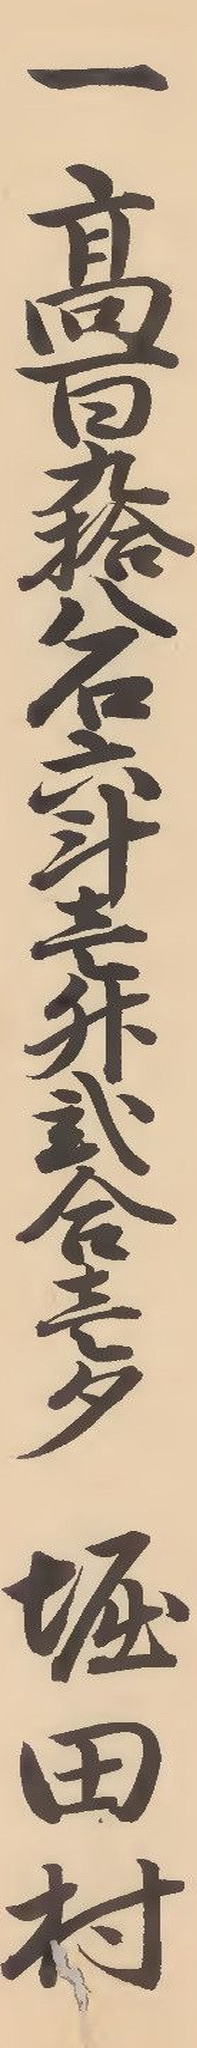一高百九拾八名六斗壱升弐合壱勺堀田村
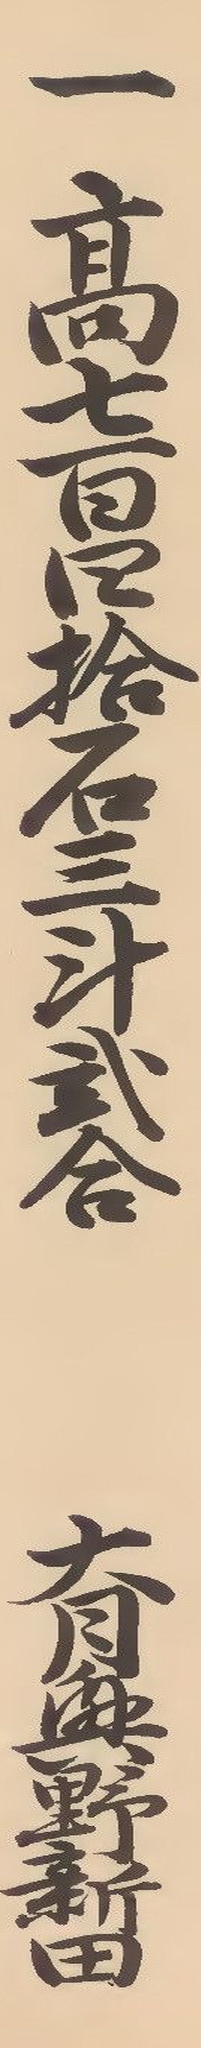一高七百四拾石三斗弐合大月興野新田
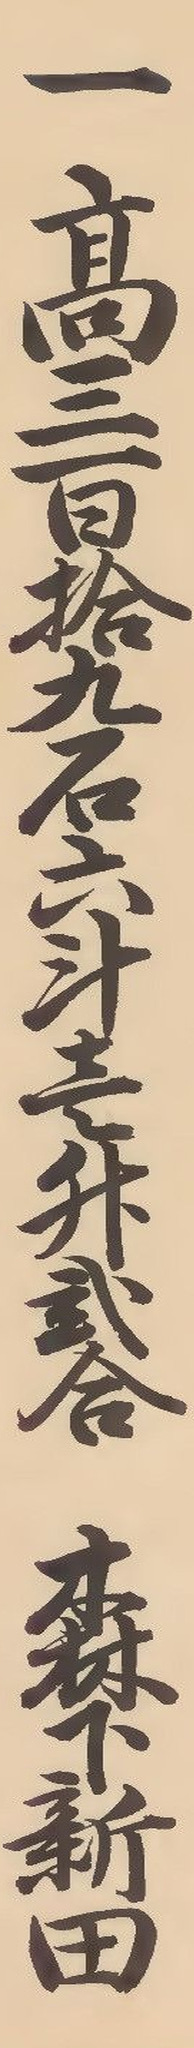一高三百拾九石六斗壱升弐合森下新田

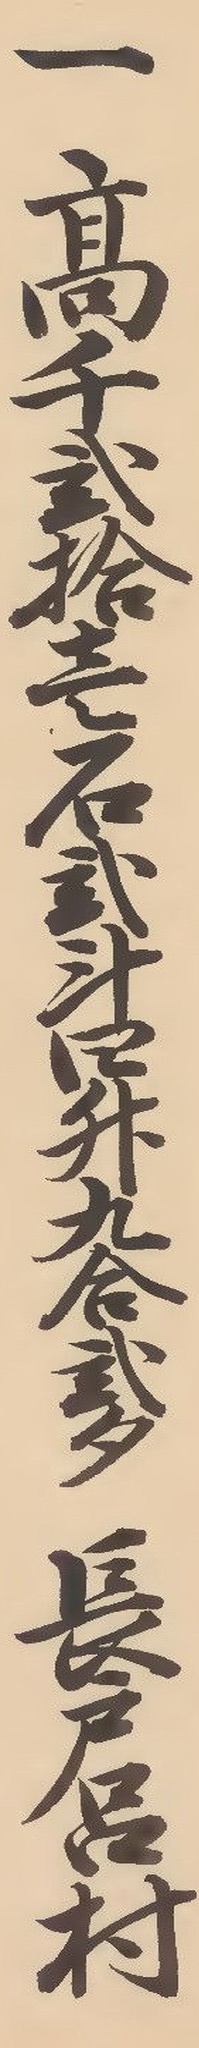一高千弐拾壱石弐斗四升九合弐勺長戸呂村
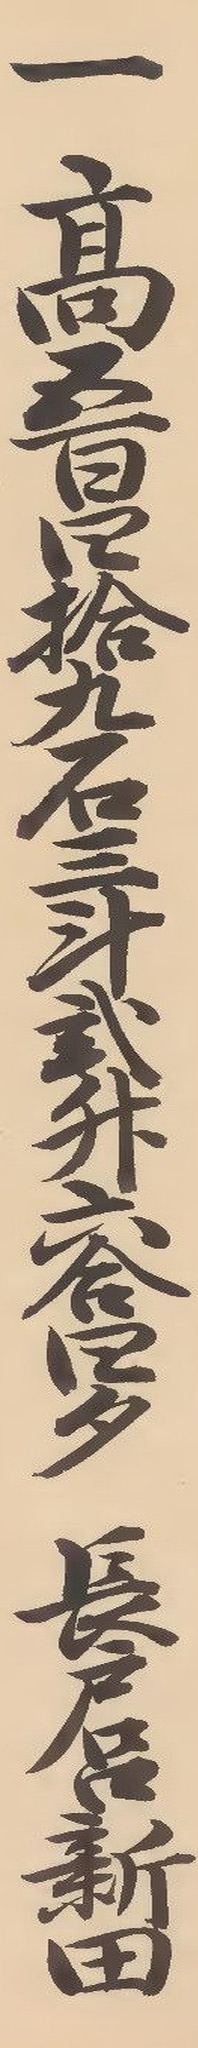一高五百四拾九石三斗弐升六合四勺長戸呂新田
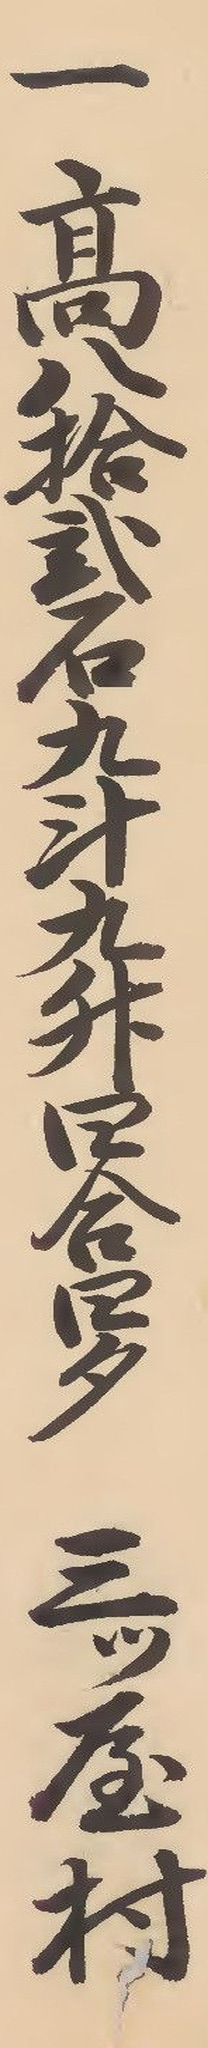一高八拾弐石九斗九升四合四勺三ッ屋村
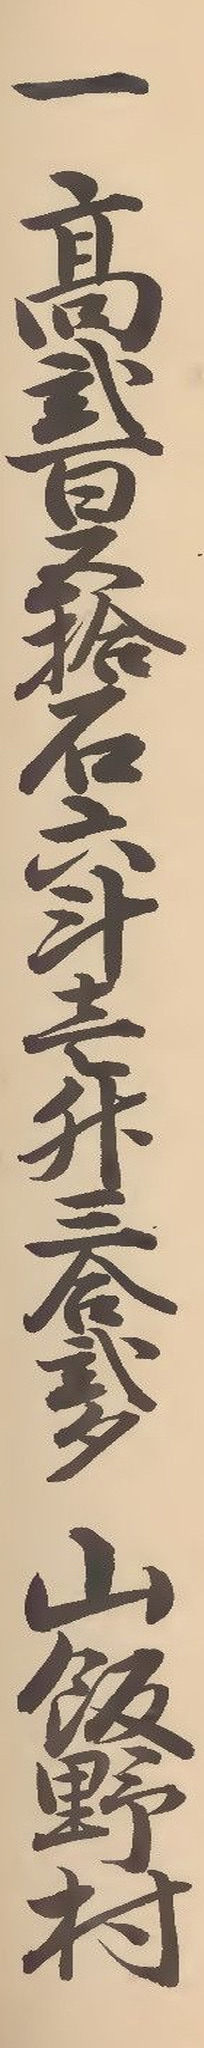一高弐百五拾石六斗壱升三合弐勺山飯野村
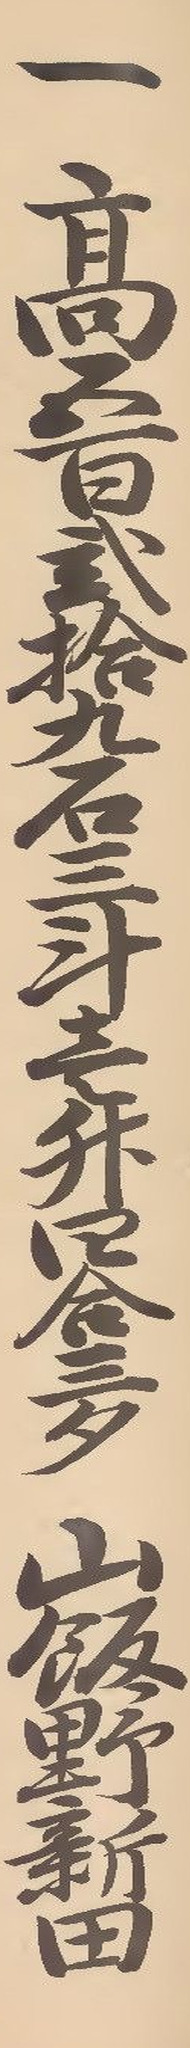一高五百弐拾九石三斗壱升四合三勺山飯野新田
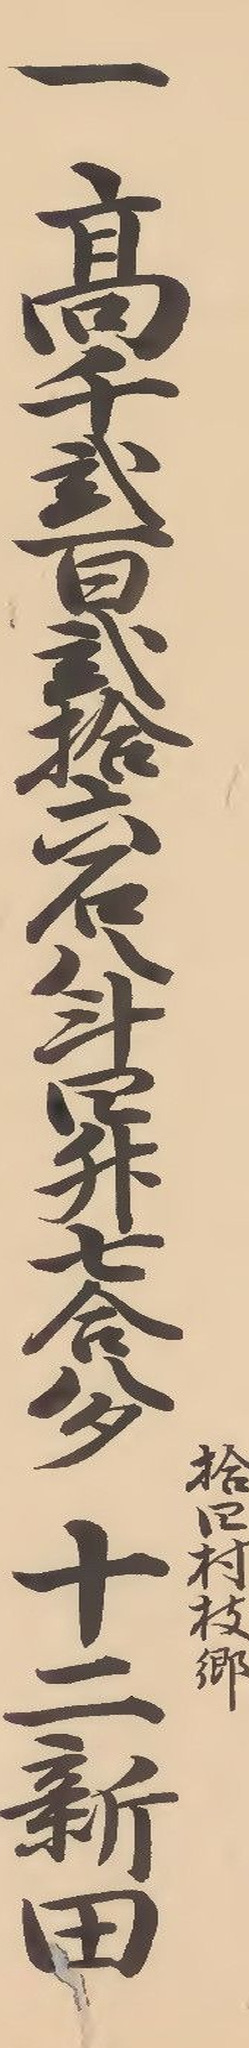一高千弐百弐拾六石八斗四升七合八勺十二新田
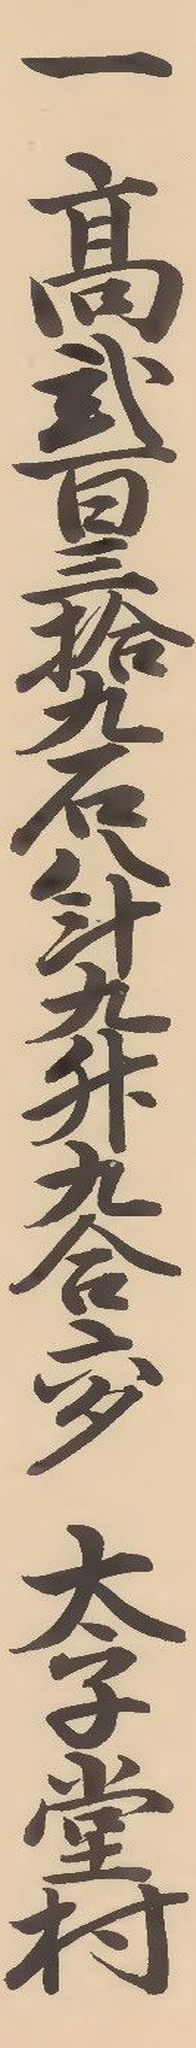一高弐百三拾九石八斗九升九合六勺太子堂村
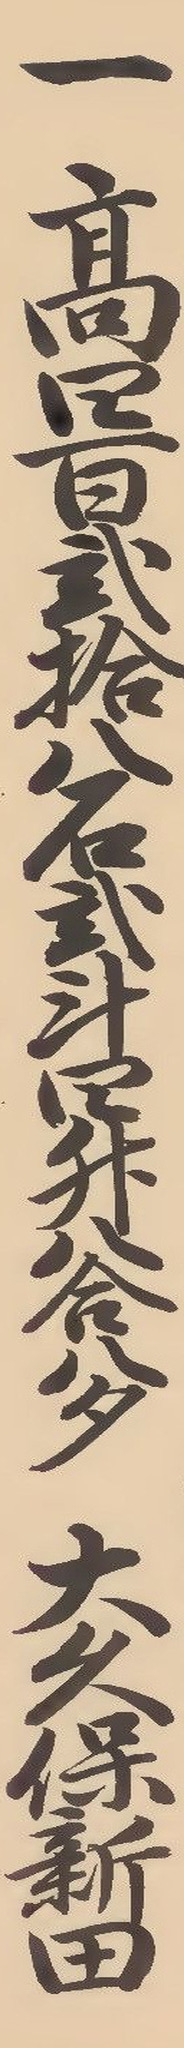一高四百弐拾八石弐斗四升八合八勺大久保新田

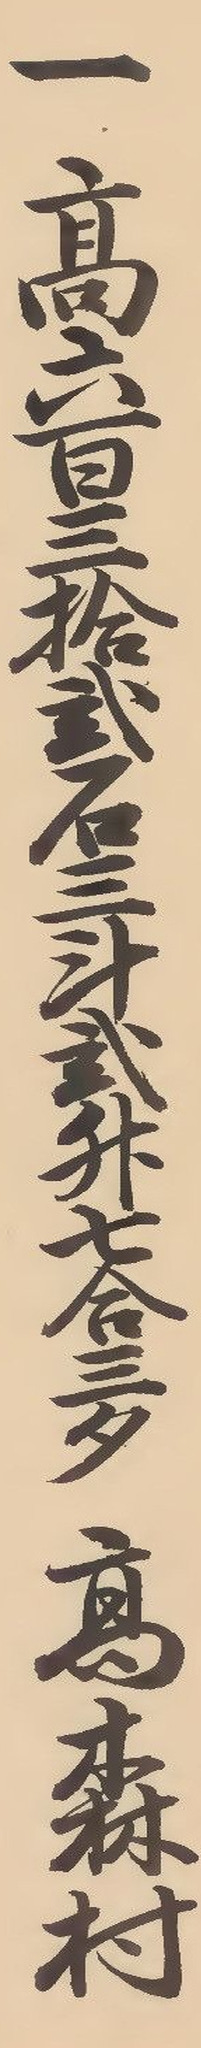一高六百三拾弐石三斗弐升七合三勺高森村
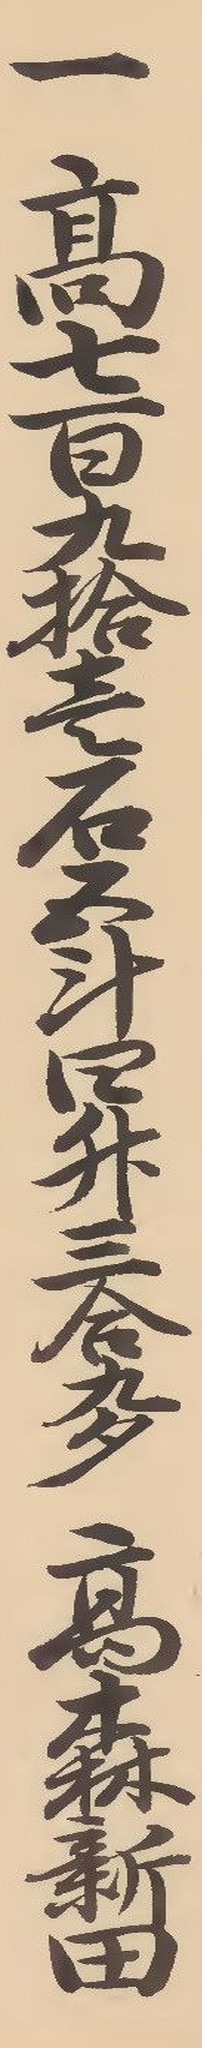一高七百九拾壱石五斗四升三合九勺高森新田
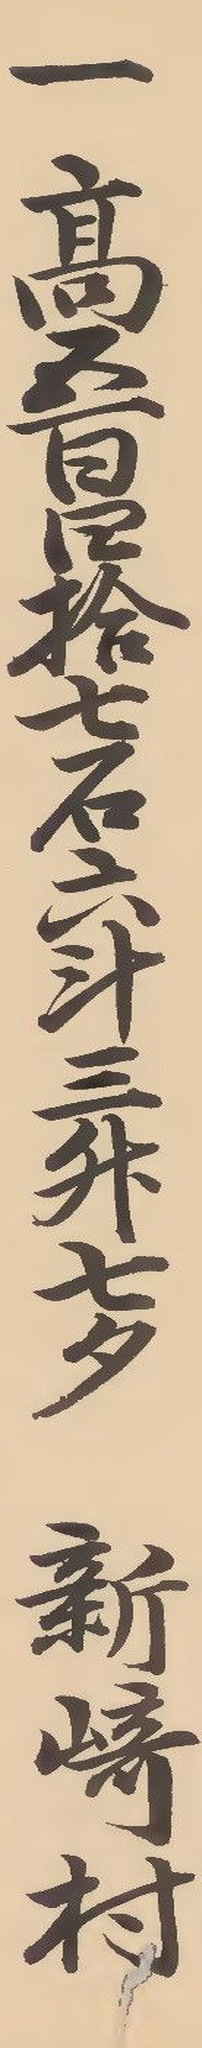一高五百四拾七石六斗三升七勺新崎村
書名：越後国郷帳　下
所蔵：国立公文書館 National Archives of Japan
